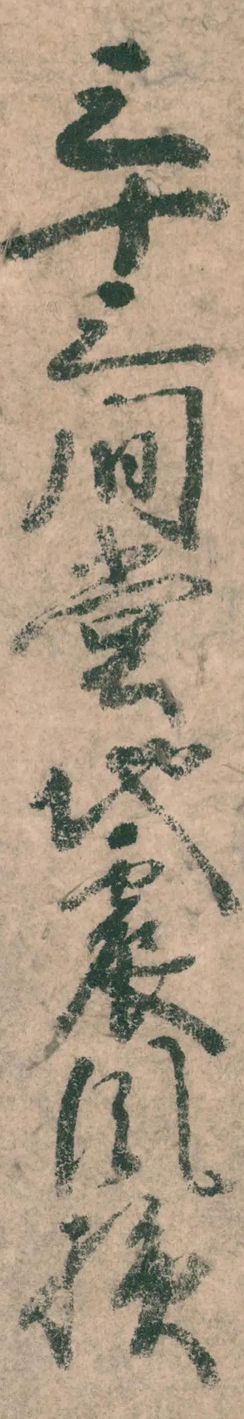三十三間堂地震風損

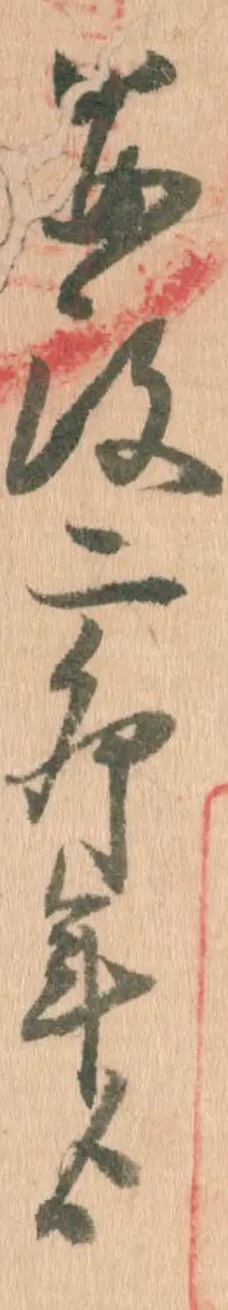安政二卯年ゟ
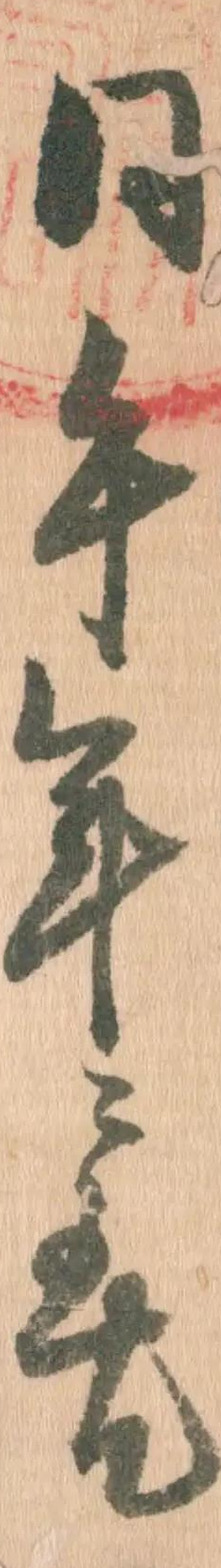同午年ニ至ル
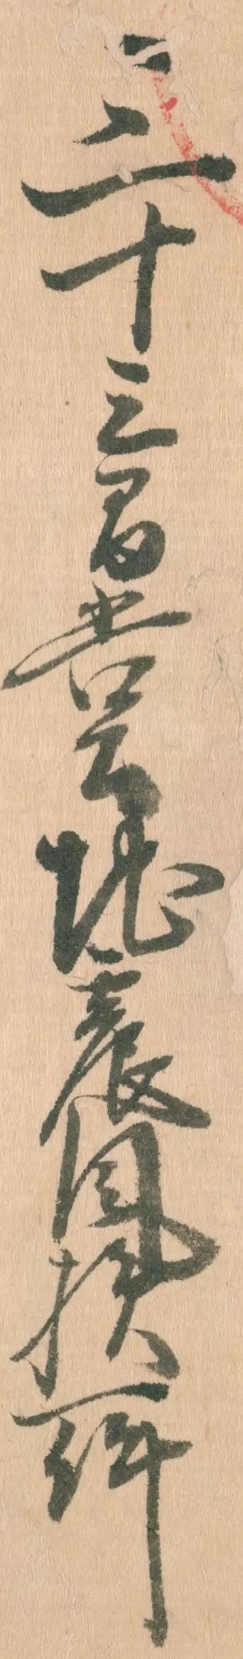三十三間堂地震風損一件

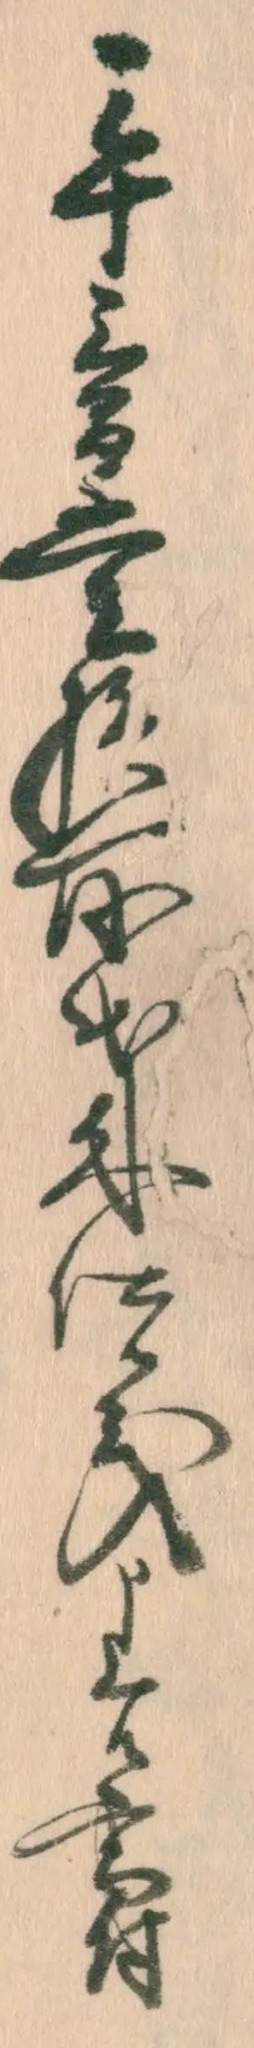│三十三間堂損所出来仕候義申上候書付
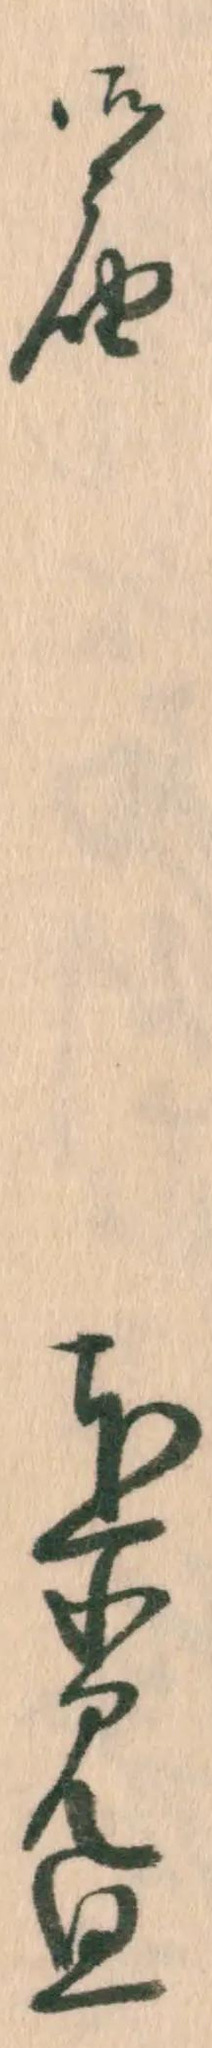│御届本所見廻
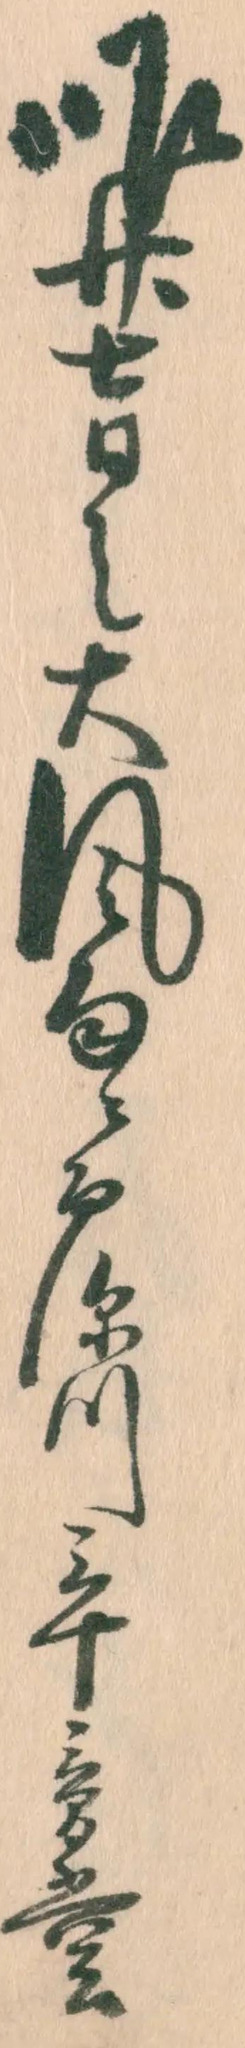昨廿七日之大風雨ニ而深川三十三間堂
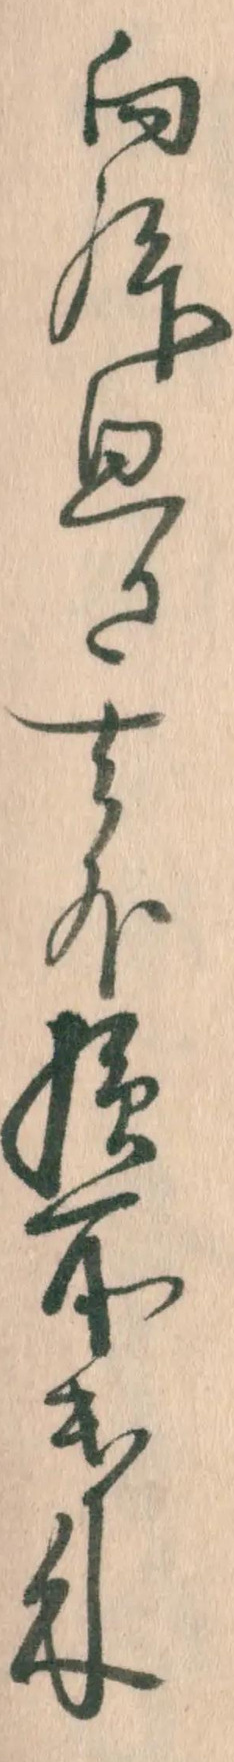向拝廻り其外損所出来

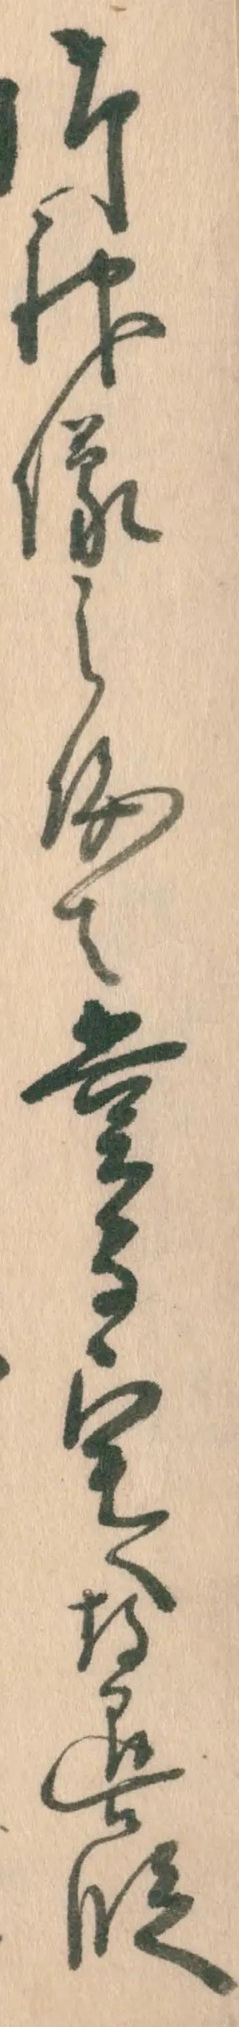御神像之儀者堂守宅へ持退候段
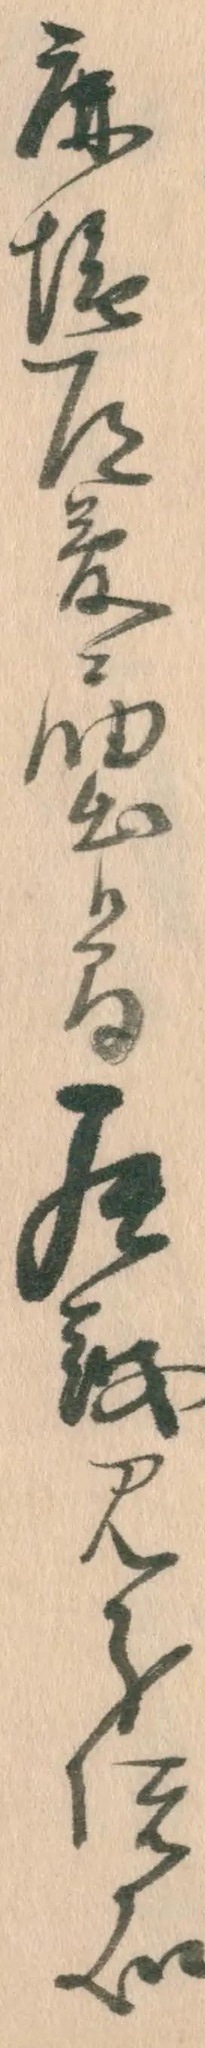鹿塩道菅届出候間罷越見分仕候処
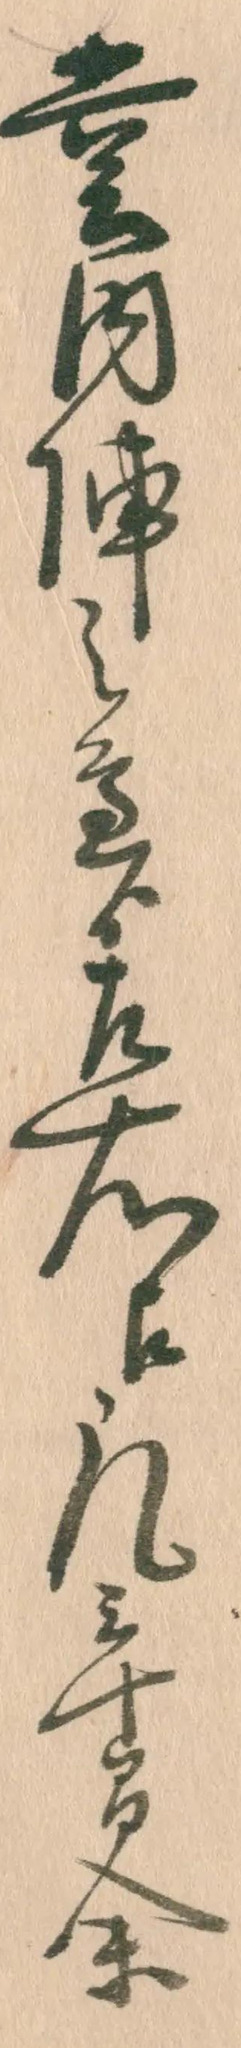堂内陣之邊ゟ左右江凡三十間余
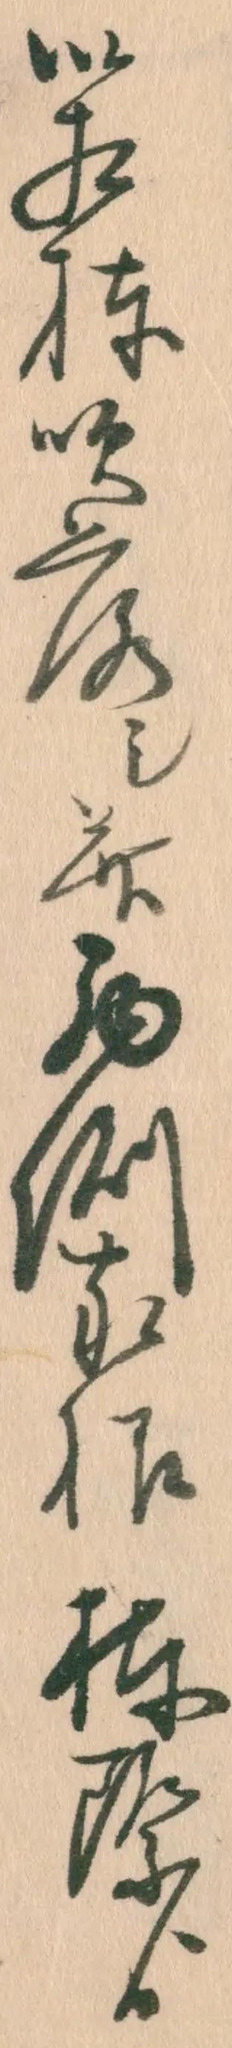箱棟吹落シ幷西側家根棟際ゟ
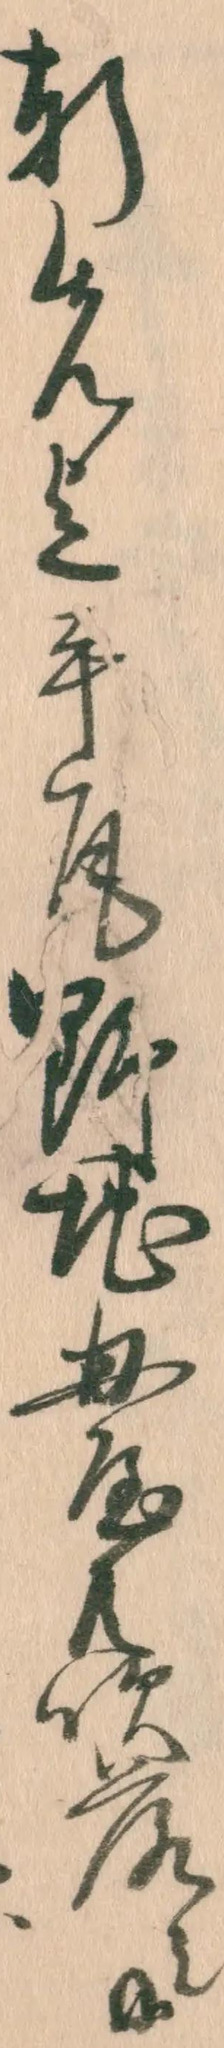軒先迄平瓦野地母屋共吹落シ候
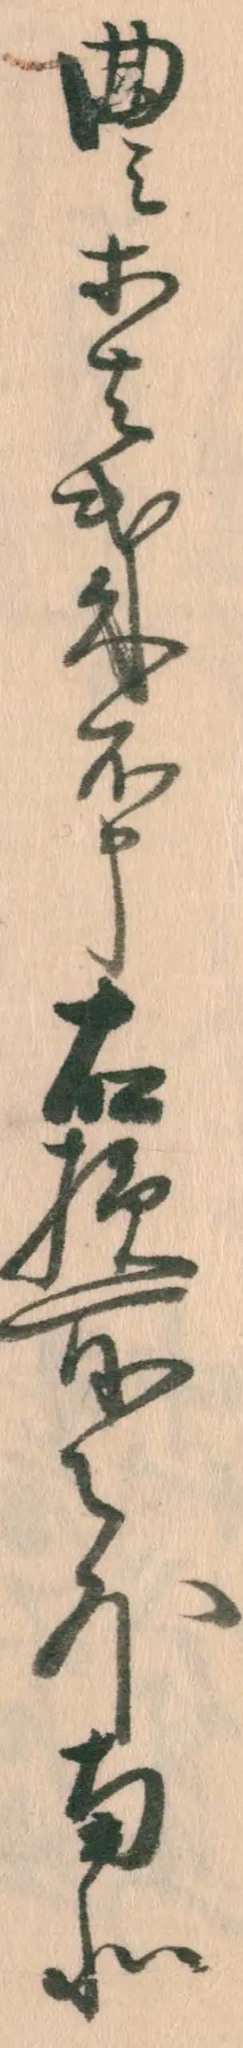曲ミ等者出来不申右損所之外南北
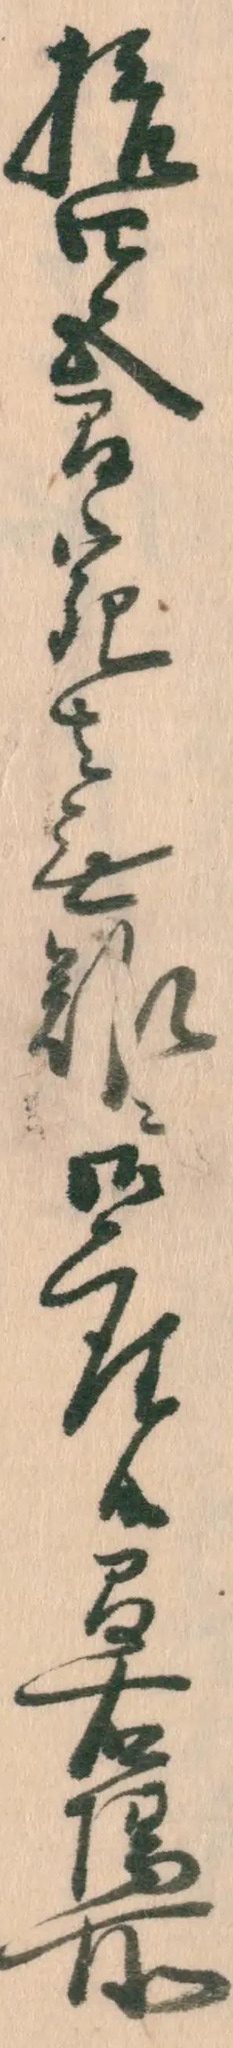拾四五間宛者無難ニ御座候間右場所
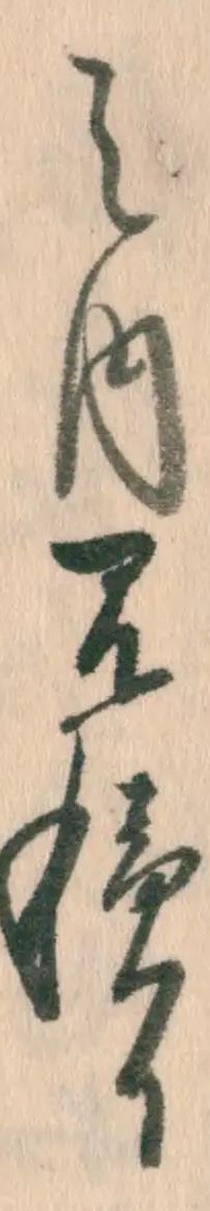之内見積り
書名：三十三間堂. [1]
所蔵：国立国会図書館 National Diet Library, JAPAN
